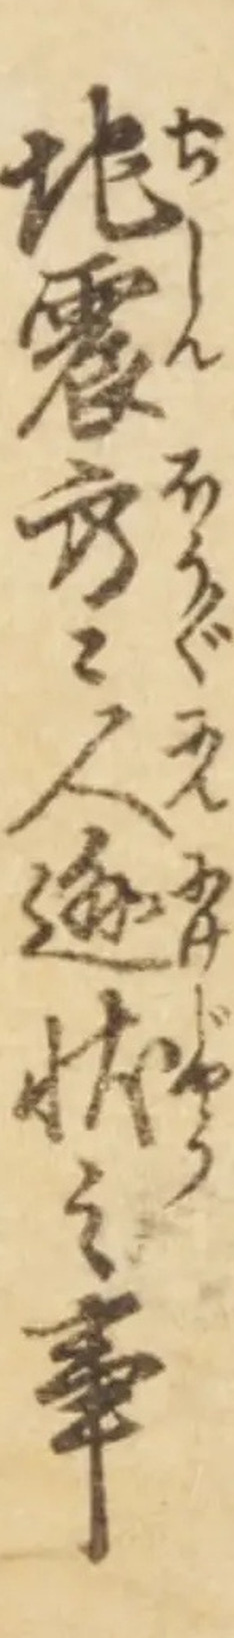地震方々人迯状之事
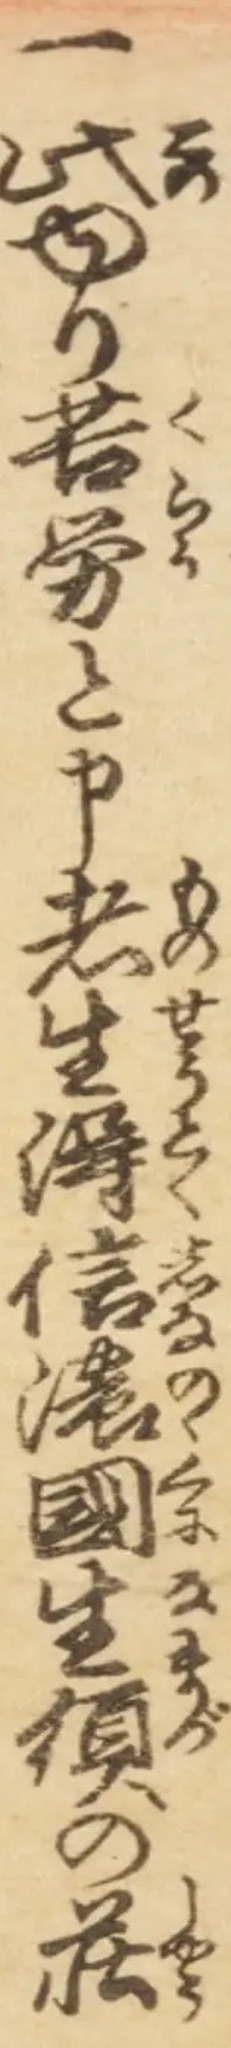一此ゆり苦労と申者生得信濃国生須の荘
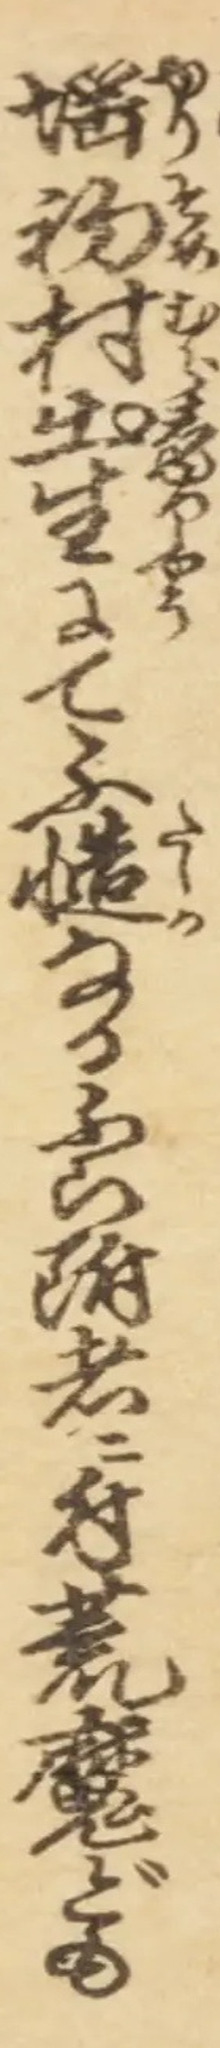揺初村出生にてふ造なるふら附者に付荒魔ども
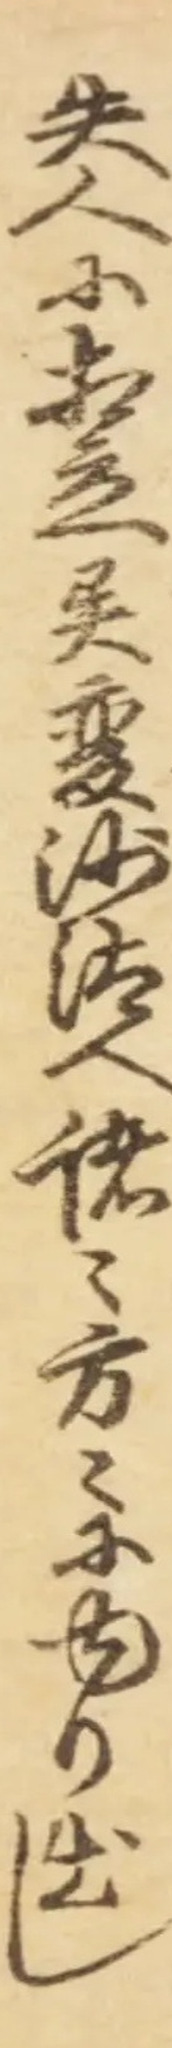失人に相立異変沙汰人諸々方々にゆり出し
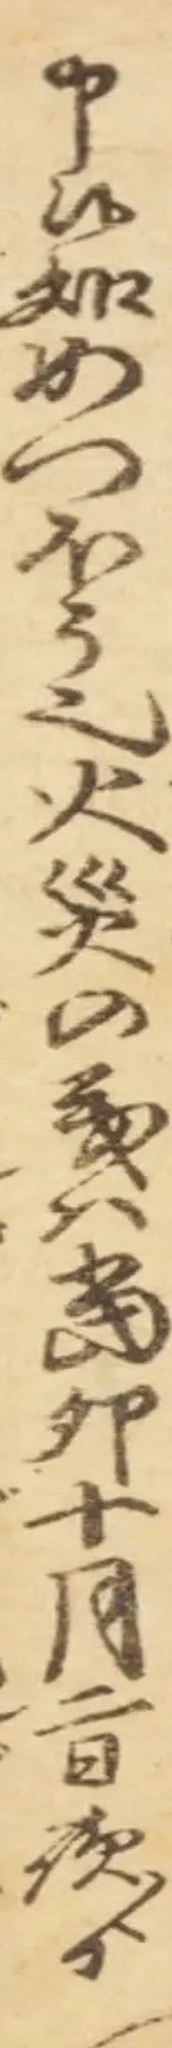申候処めいほう也火災の義は當卯十月ニ日夜ゟ
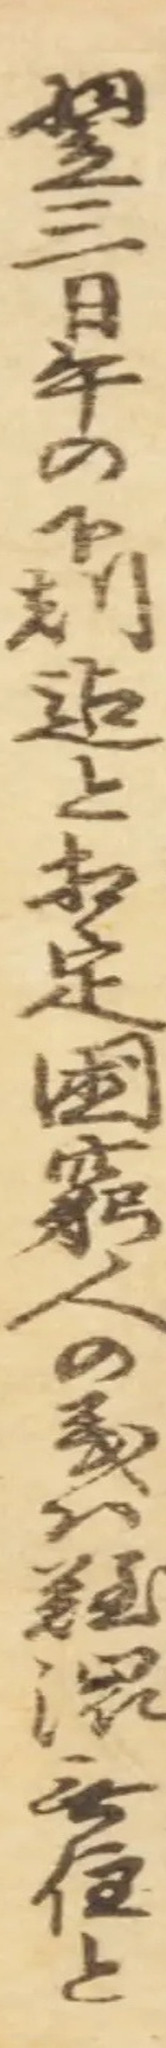翌三日午の下刻迄と相定困窮人の義は難渋無住と
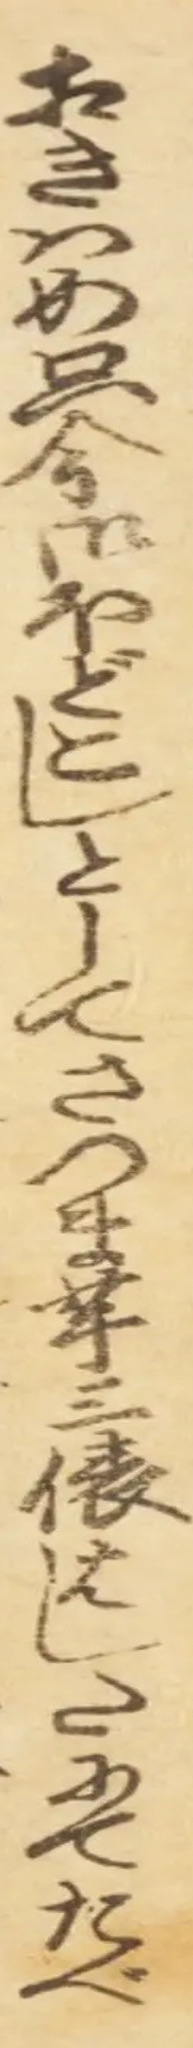相きはめ只今御ほどこしとしてさつま芋三俵はしたにてたべ
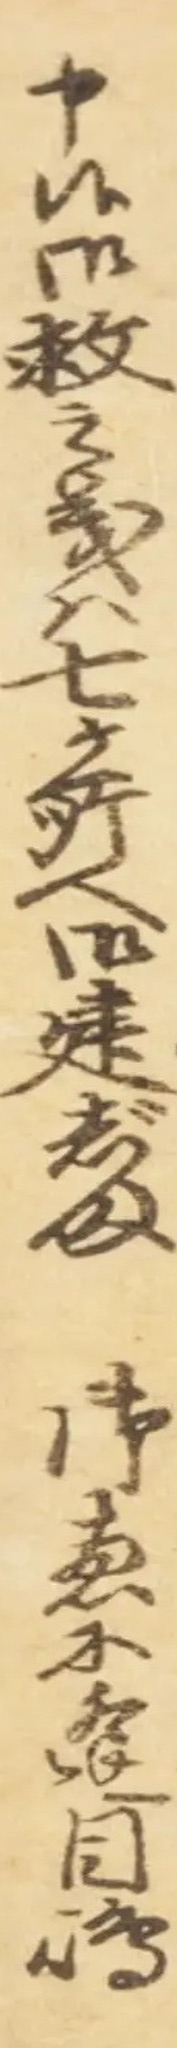申候御救の義は七ヶ所へ御建じま御恵に逢目嶋
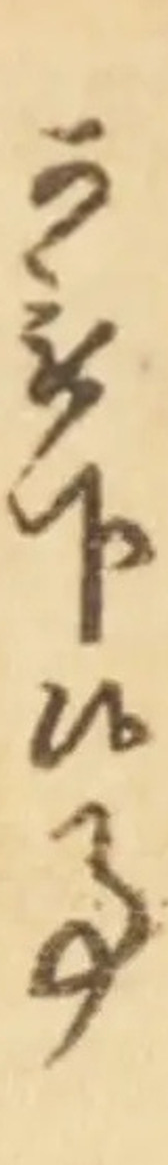可被下候事
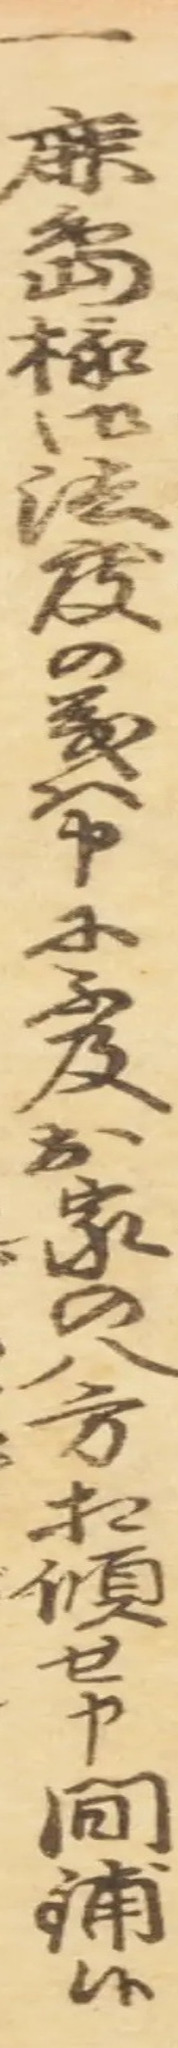一鹿島様御法度の義は申に不及お家の八方相傾せ申間鋪候
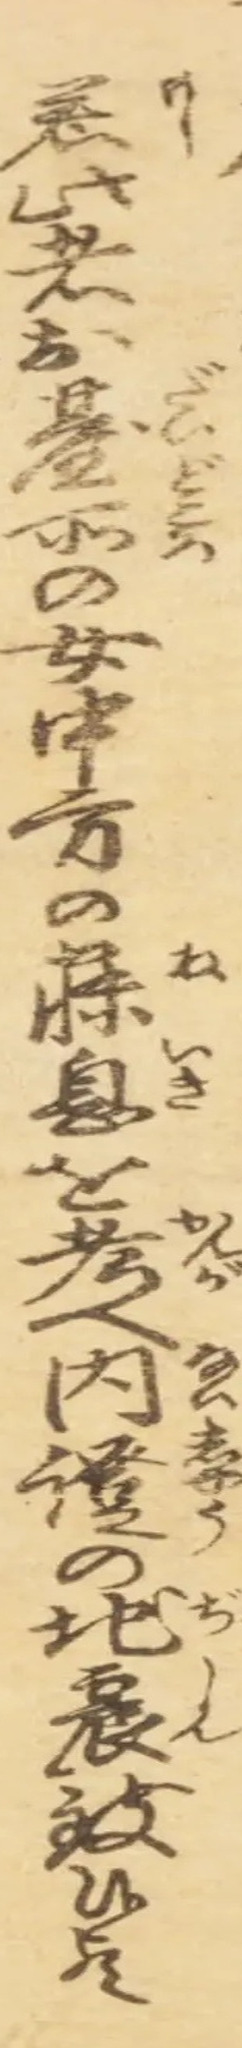若此者お台所の女中方の寝息を考へ内證の地震致候歟
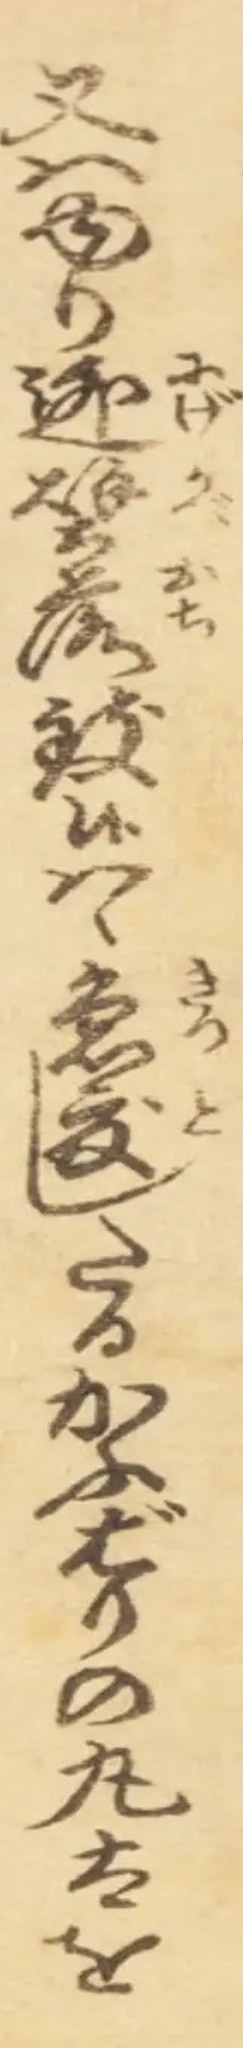又はゆり迯壁落致候はゝ急度したるかふばりの丸太を
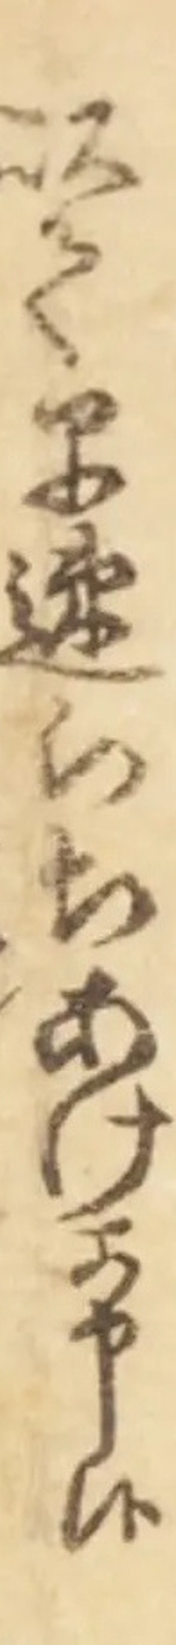以て早速らちあけ可申候
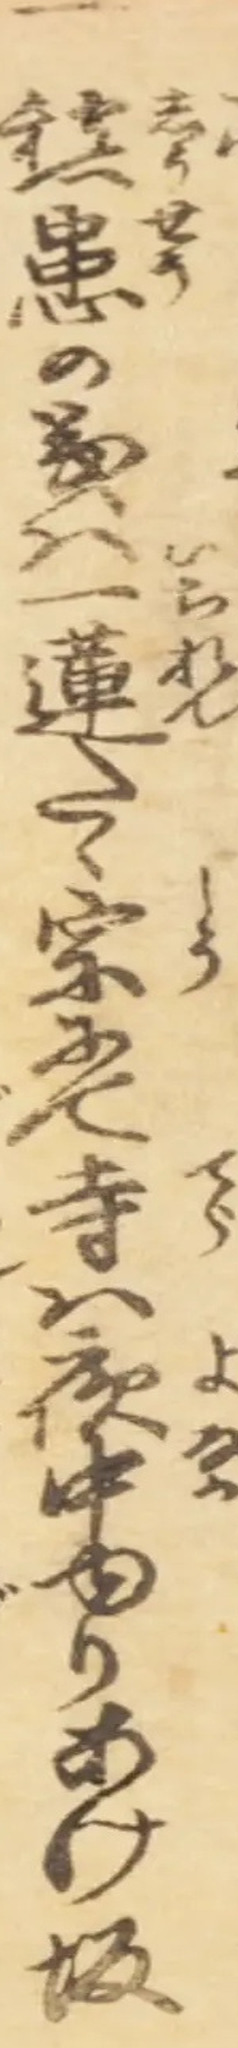一愁患の義は一連たゝ宗にて寺は夜中ゆりあけ坂
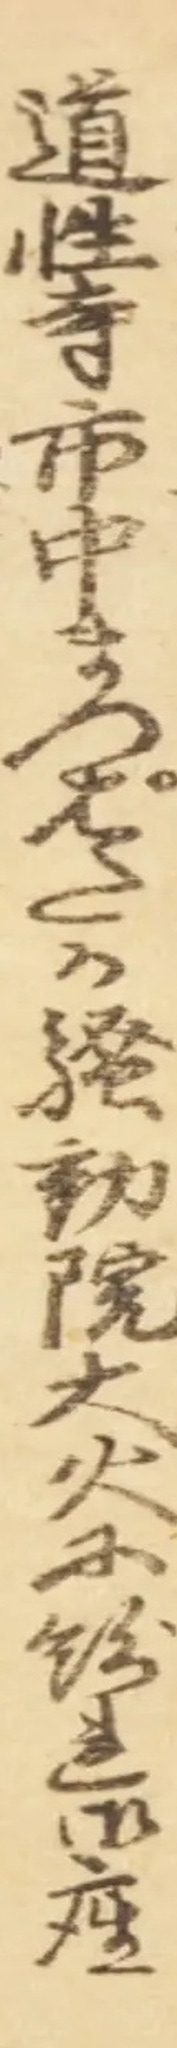道性寺市中まつばたか騒動院大火に紛れ御座
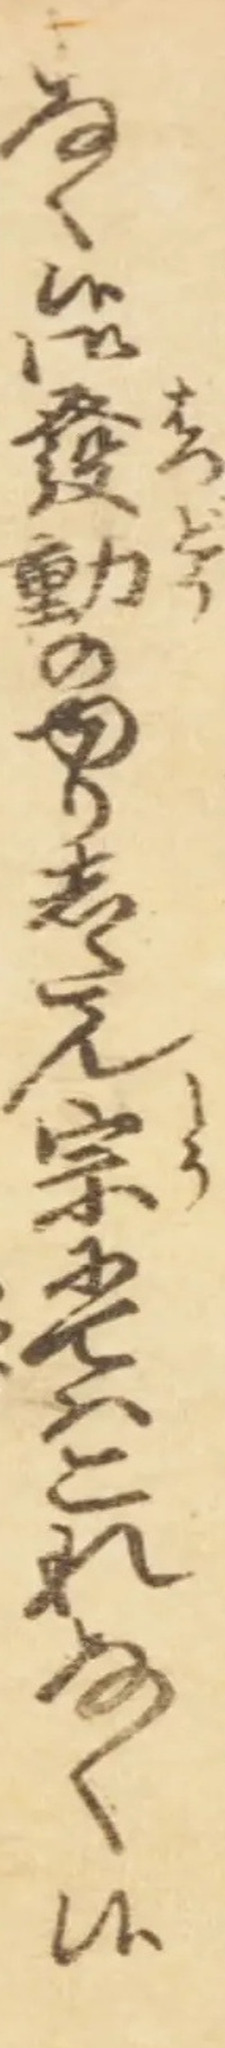なく候御発動のゆりしたん宗にてはこれなく候
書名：地震方々人迯状之事
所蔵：国立国会図書館 National Diet Library, JAPAN
